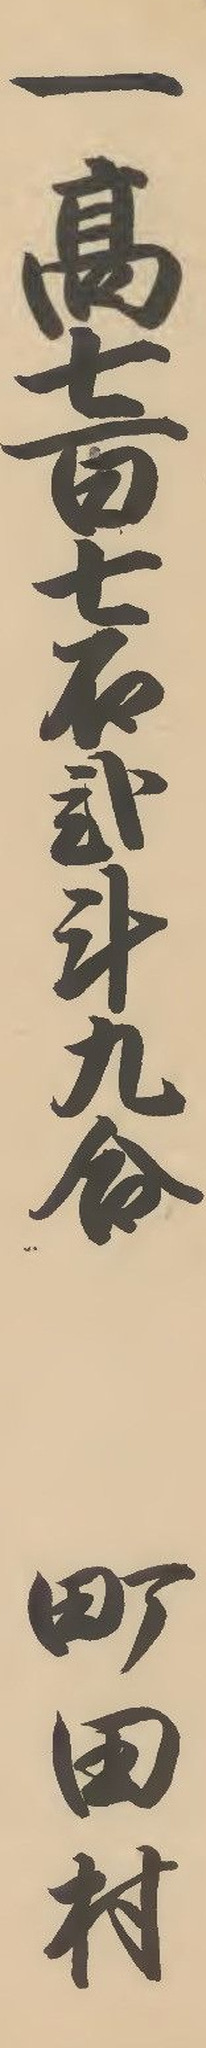一髙七百七石弐斗九合町田村
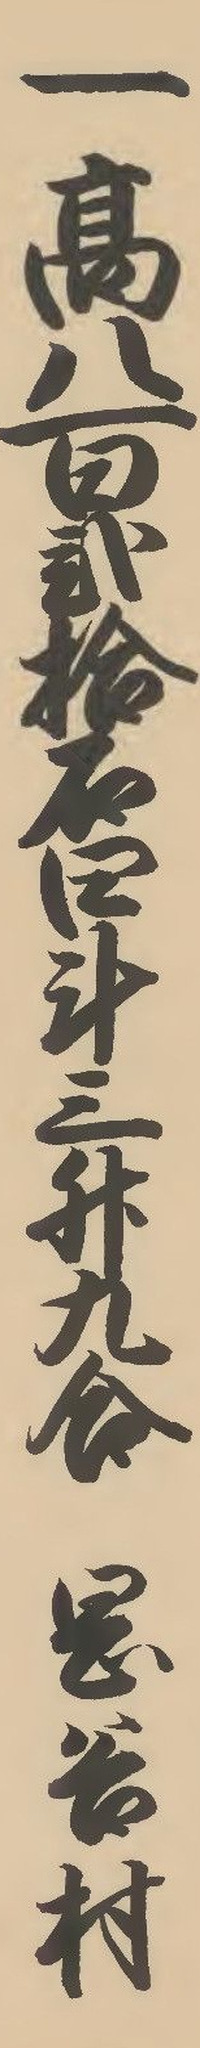一髙八百弐拾石四斗三升九合岡谷村
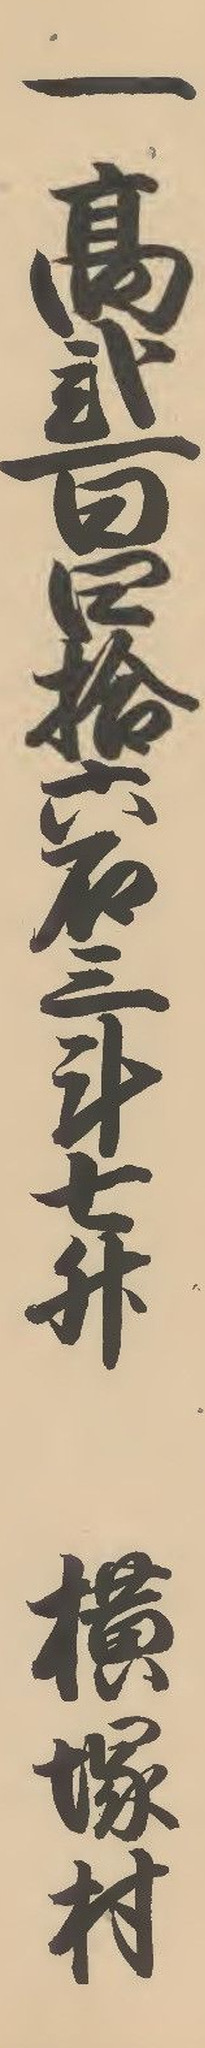一髙弐百四拾六石三斗七升横塚村
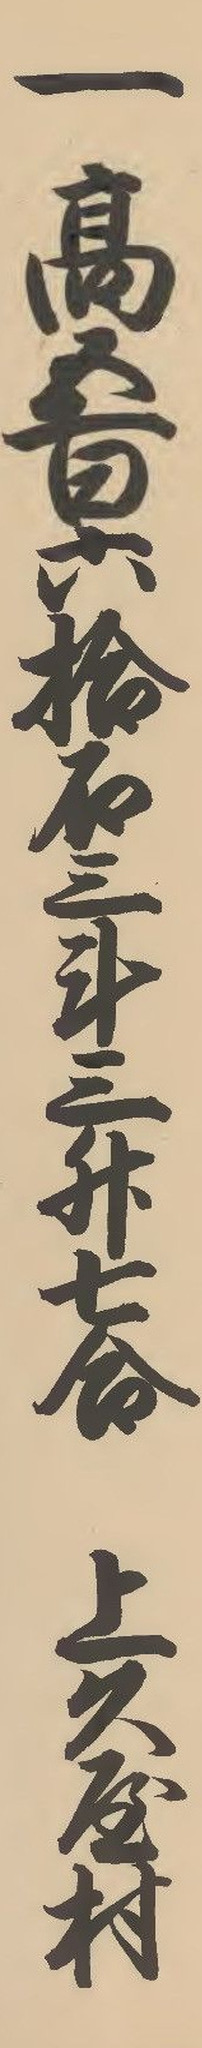一髙五百六拾石三斗三升七合上久屋村
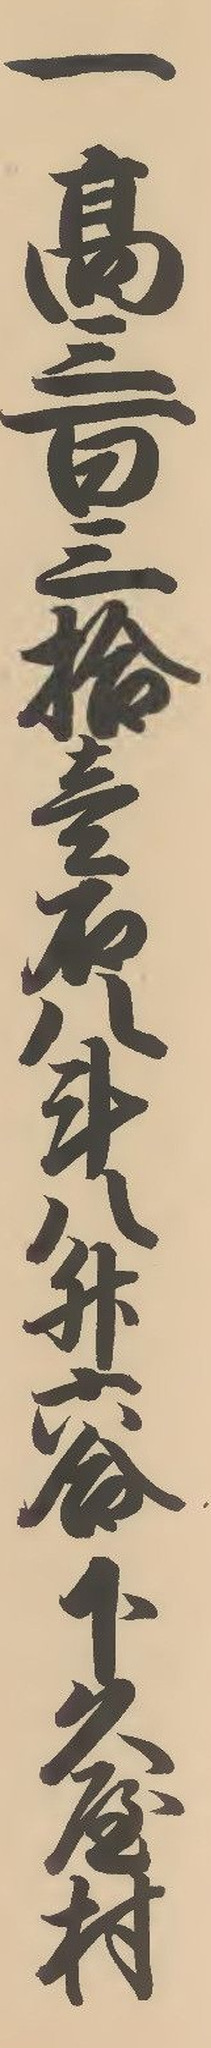一髙三百三拾壱石八斗八升六合下久屋村
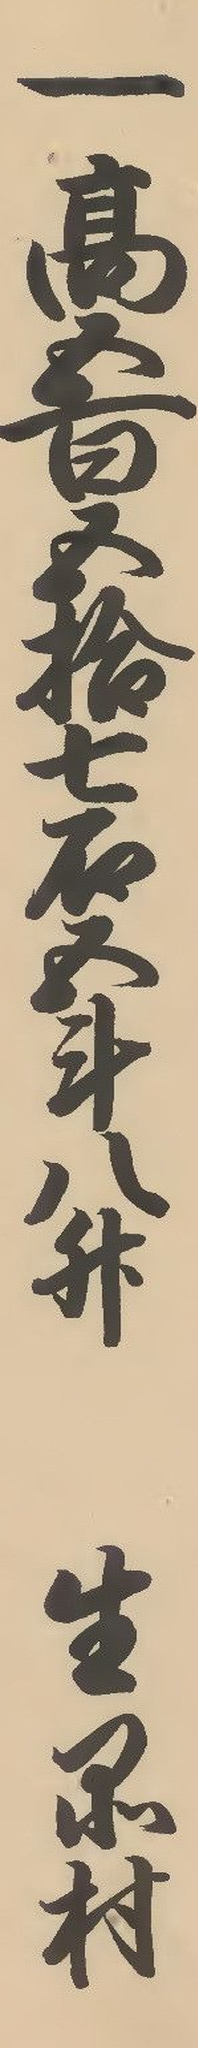一髙五百五拾七石五斗八升生品村
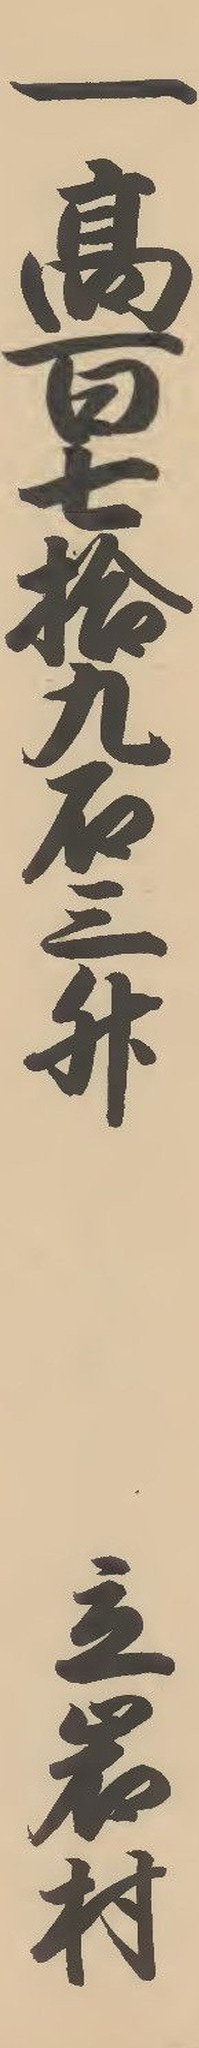一髙百七拾九石三升立岩村
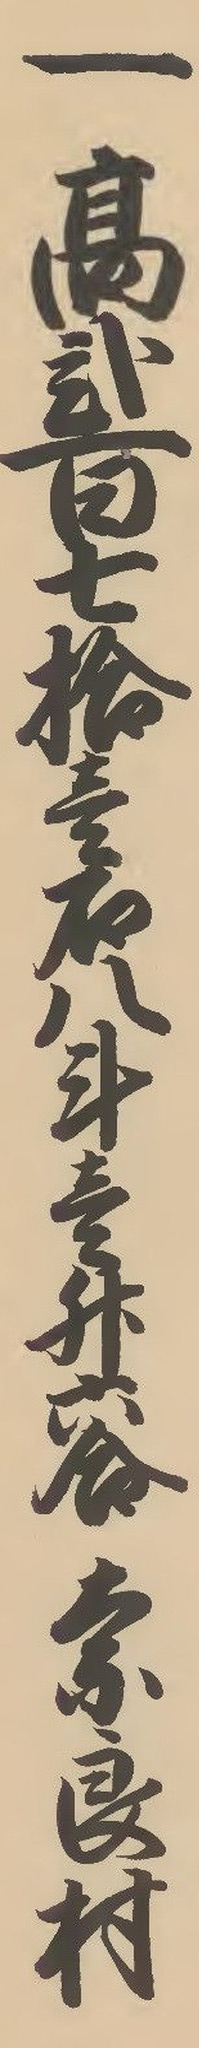一髙弐百七拾壱石八斗壱升六合奈良村

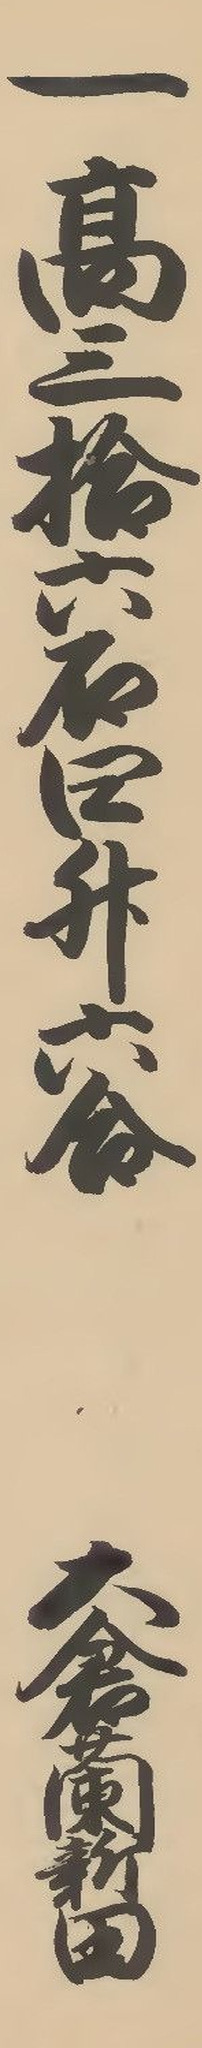一髙三拾六石四升六合大倉蘭新田
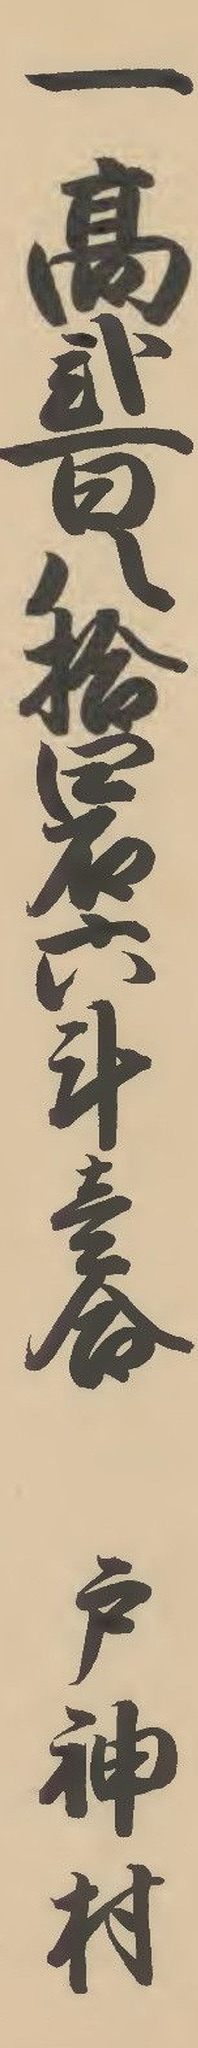一髙弐百八拾四石六斗壱合戸神村
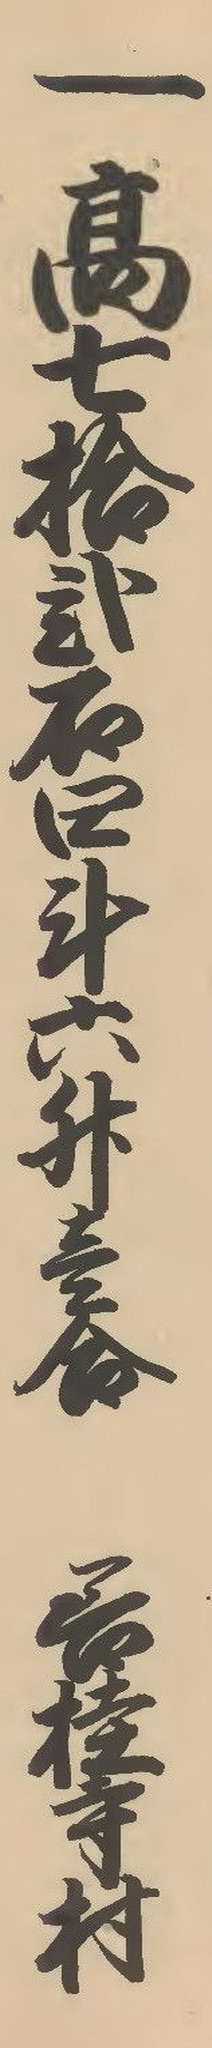一髙七拾弐石四斗六升壱合善桂寺村
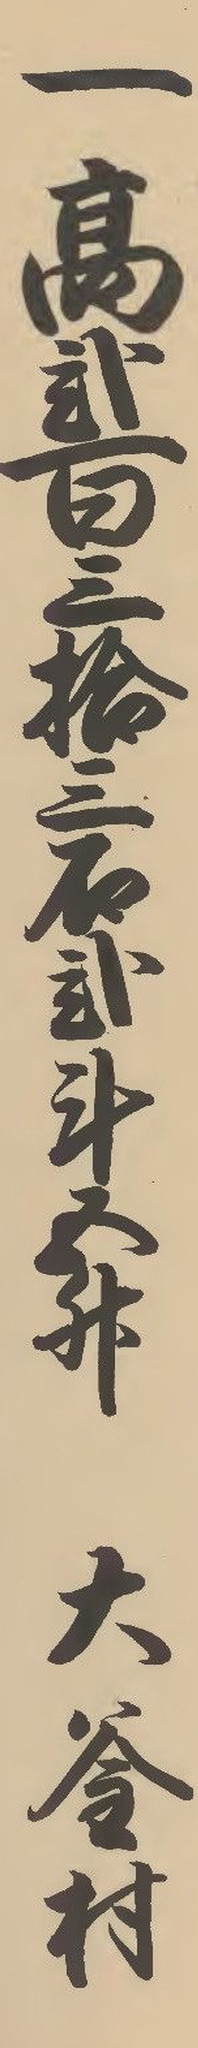一髙弐百三拾三石弐斗五升大釜村
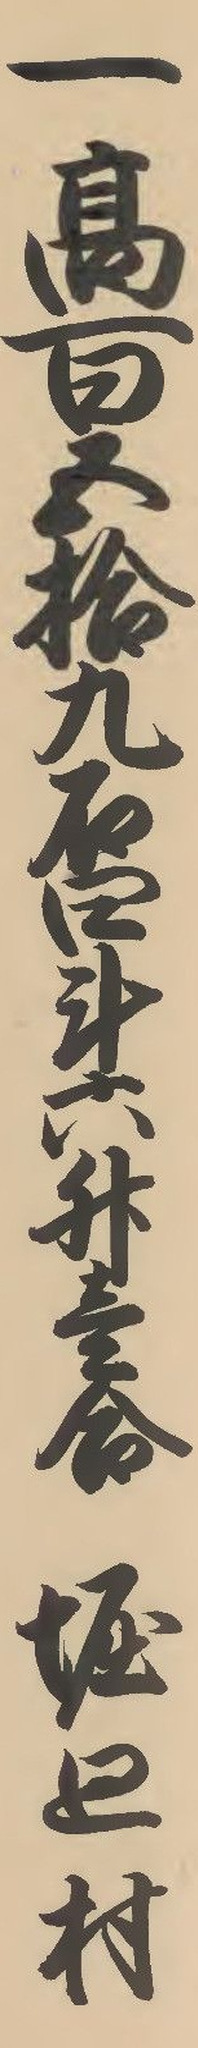一髙百五拾九石四斗六升壱合堀廻村
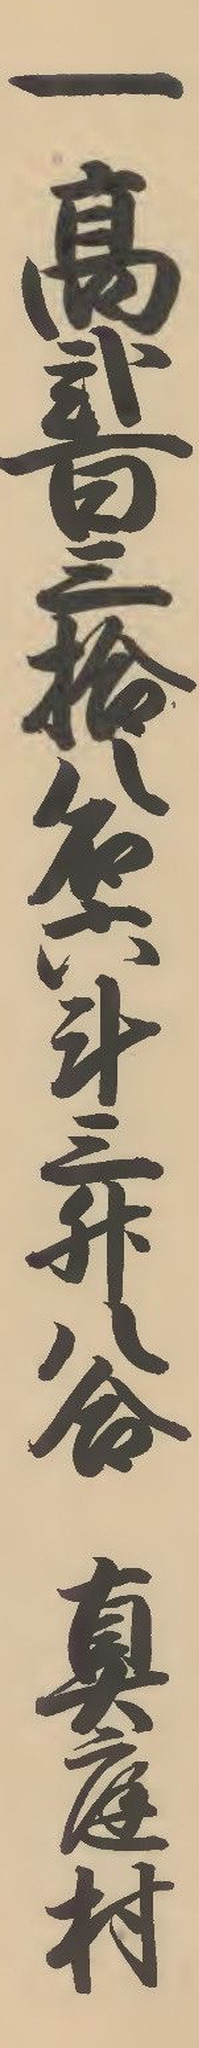一髙弐百三拾八石六斗三升八合真庭村
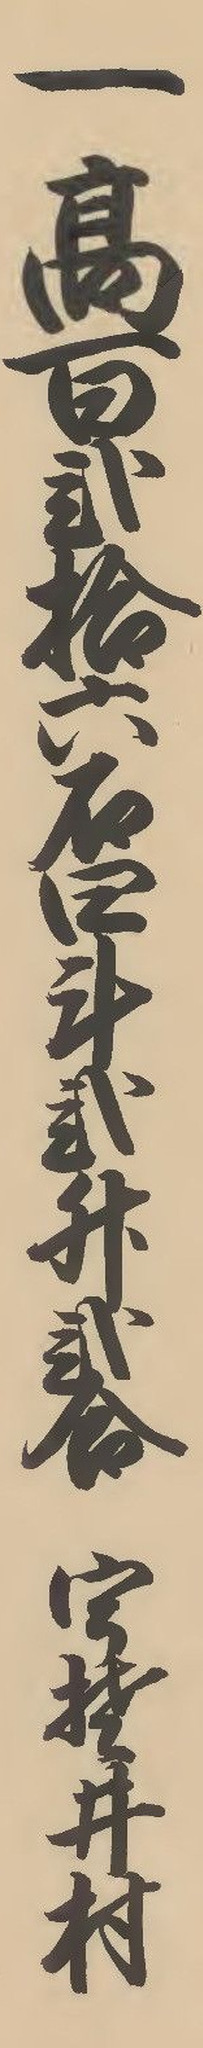一髙百弐拾六石四斗弐升弐合宇井村
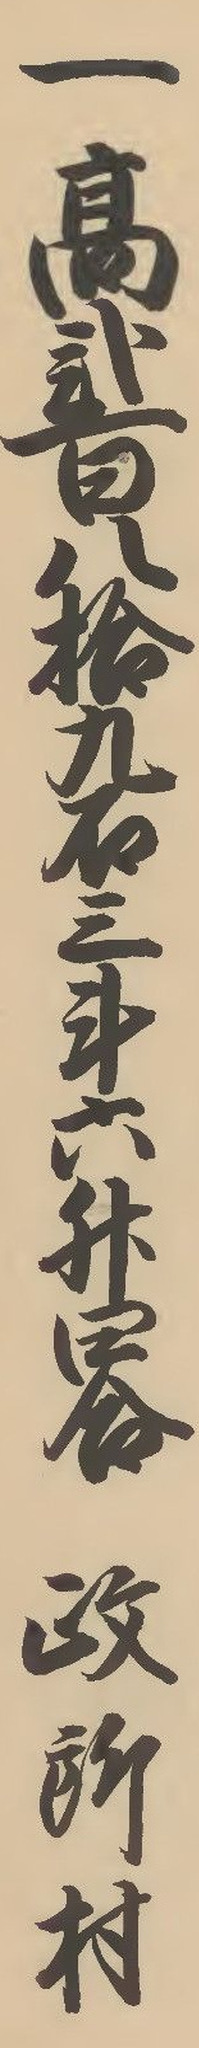一髙弐百八拾九石三斗六升四合政所村
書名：上野国郷帳
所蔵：国立公文書館 National Archives of Japan
